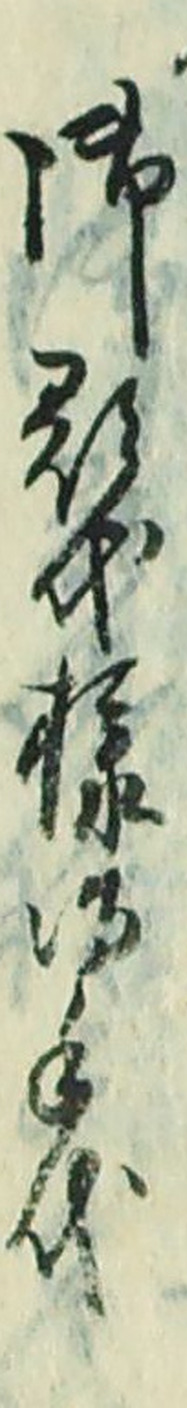御郡代様御手代
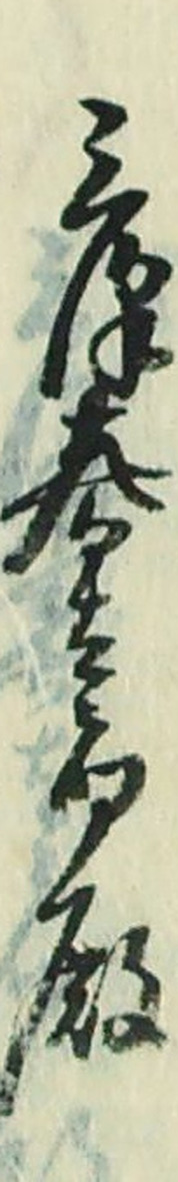三沢春太郎殿
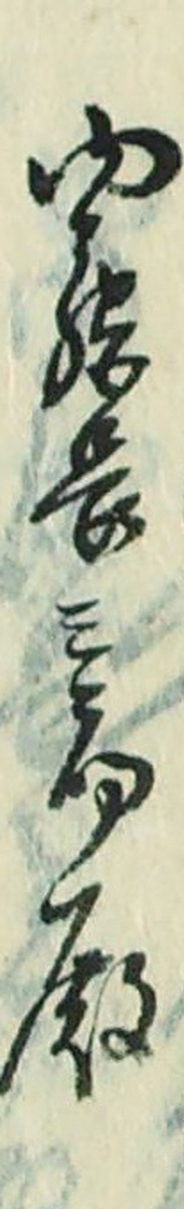内藤長三郎殿
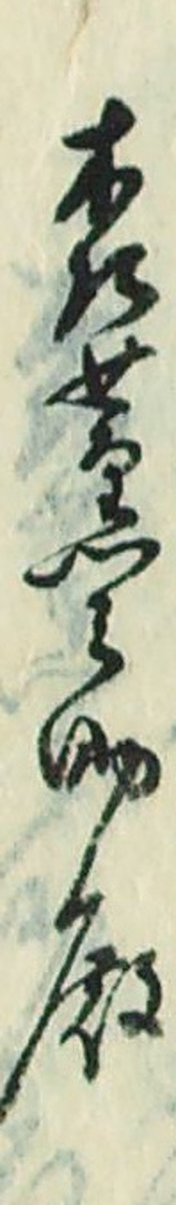森薫之助殿
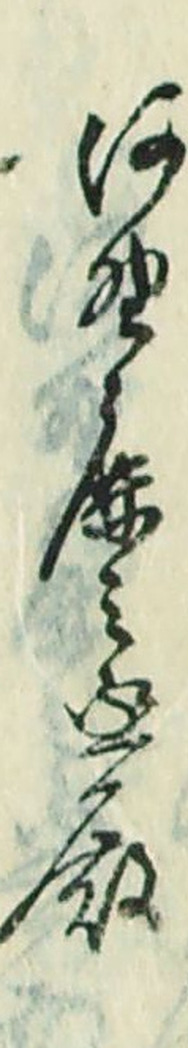河野鹿之丞殿

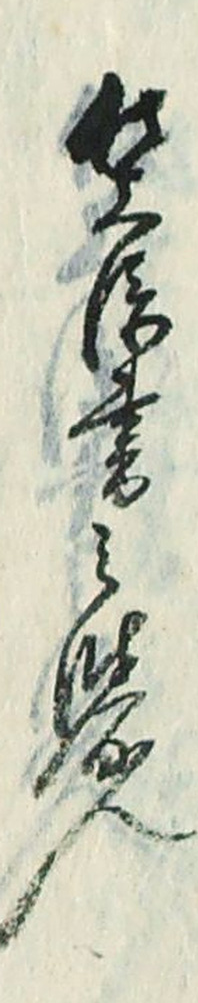仕上添書之覚
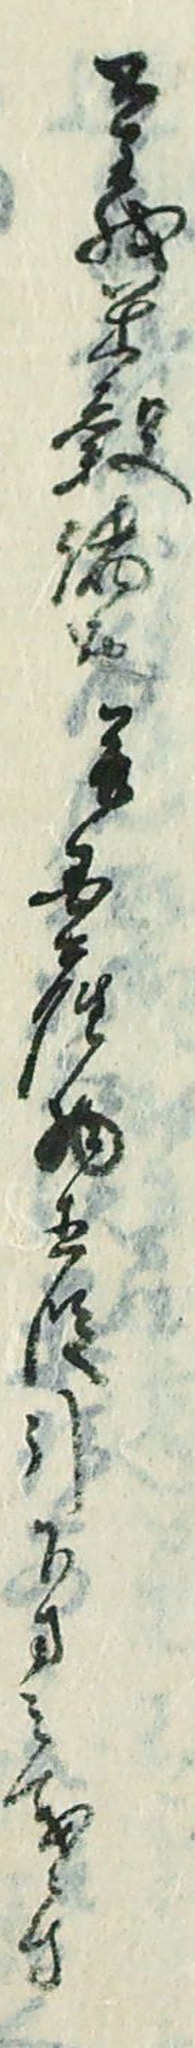公義米穀諸色幷国産物直段引下方之義に付
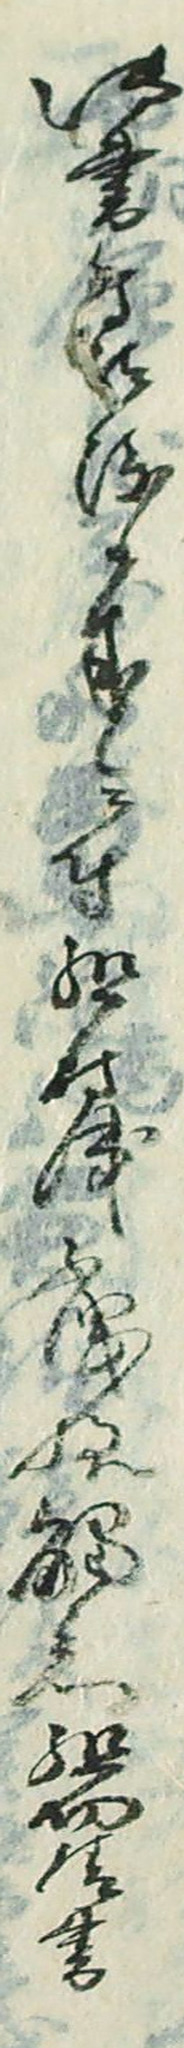御書付御渡被成候に付組村浦不洩様触知組切請書
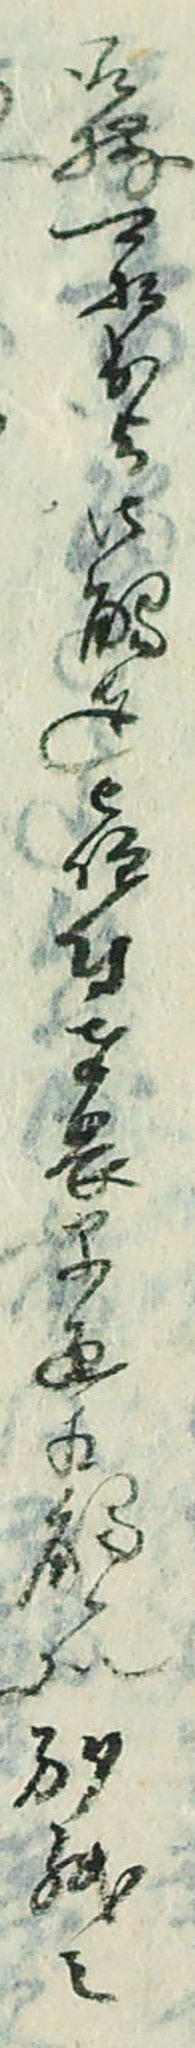取揃可指出旨御触達被仰付奉畏早速相触候処別紙之
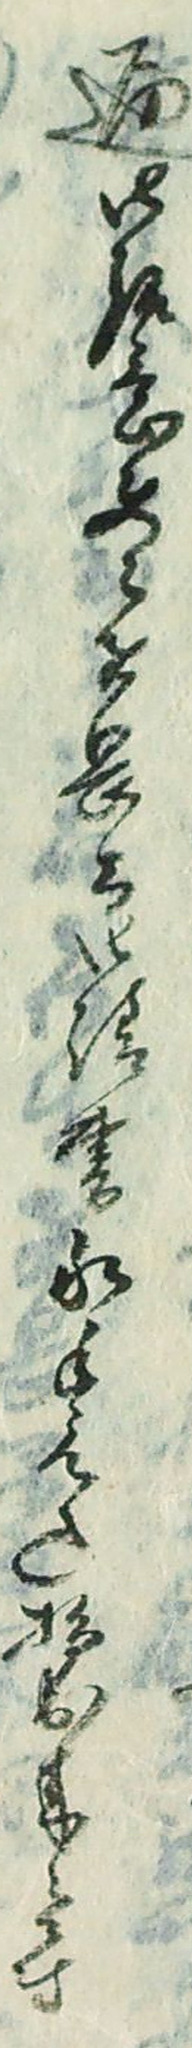通御趣意夫々奉畏旨御請書私手元迄指出来候に付
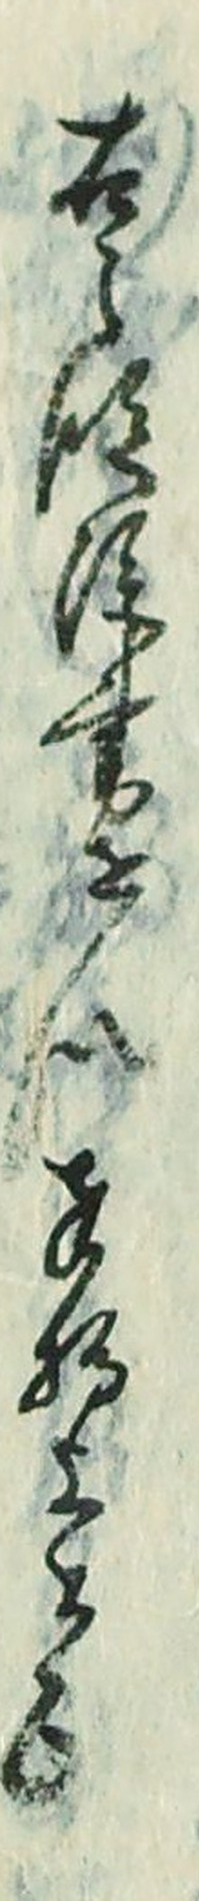右之段添書を以奉指上候以上
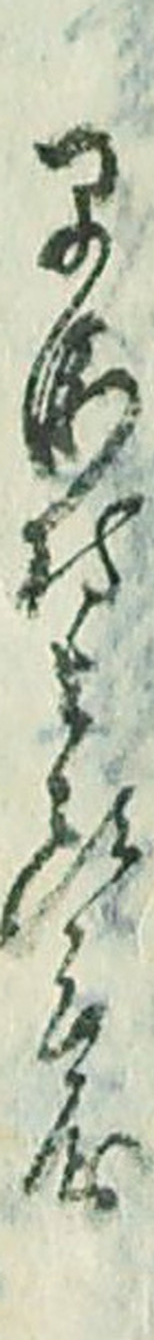早渕村与頭庄屋
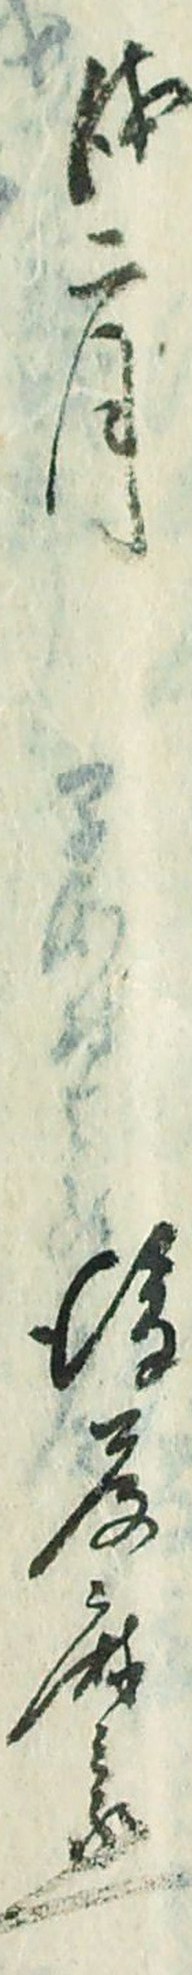戌二月後藤麻之丞
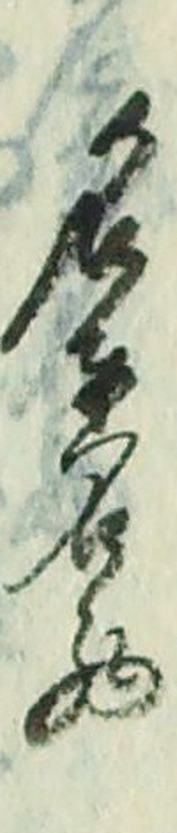名東名西
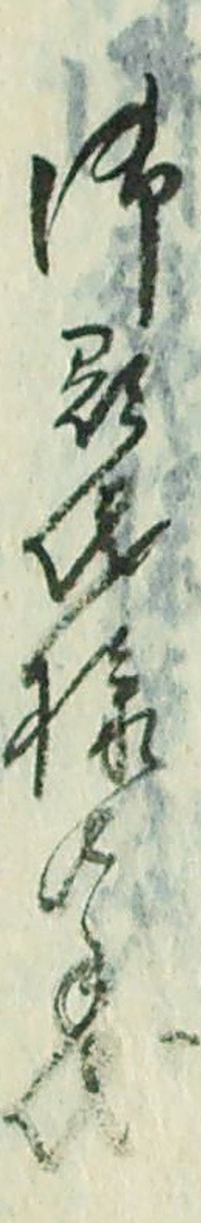御郡代様御手代
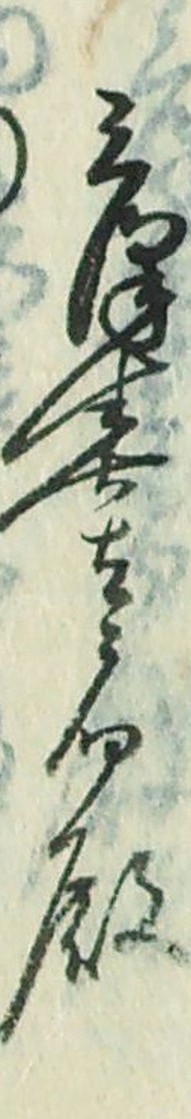三沢春太郎殿
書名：諸御用御□受書控
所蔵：鳴門教育大学 Naruto University of Education
